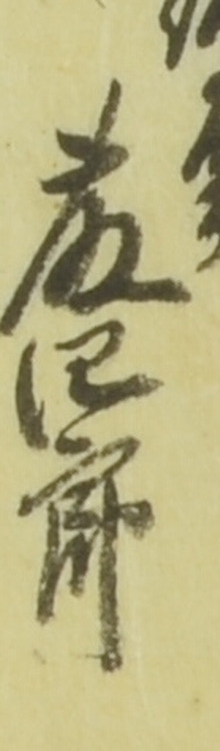藤四郎
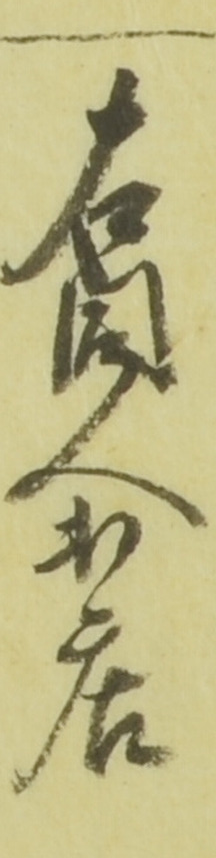右同人本店
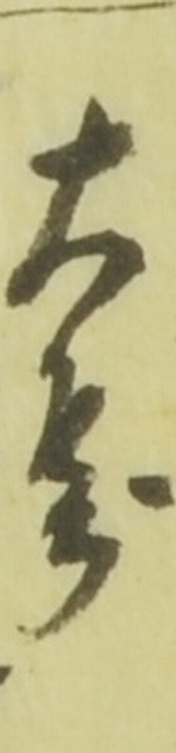茂兵衛
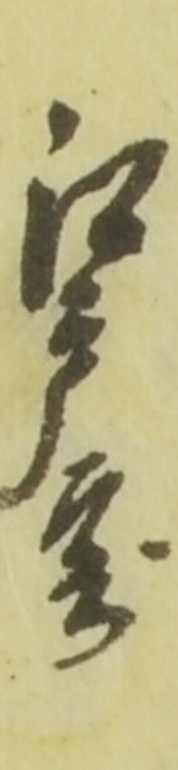江戸屋
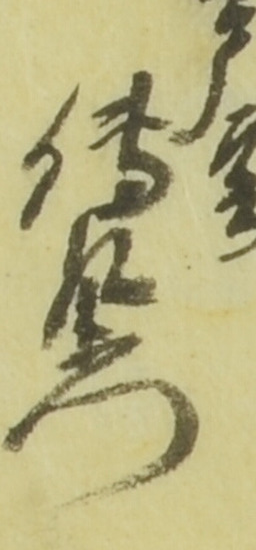伝左衛門
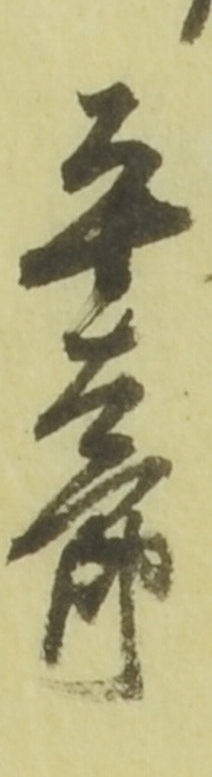平太郎
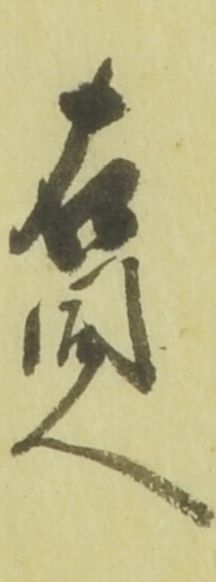右同人
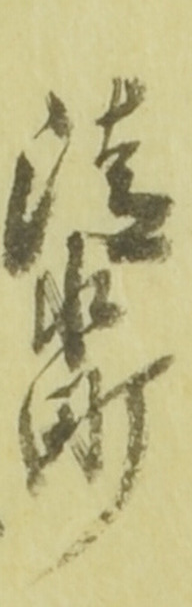清水町
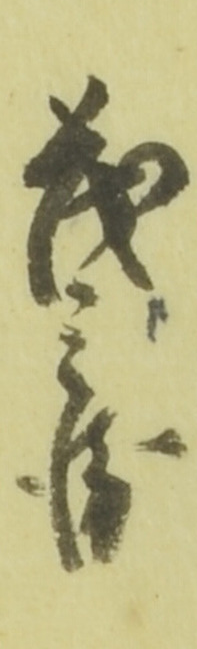茂兵衛
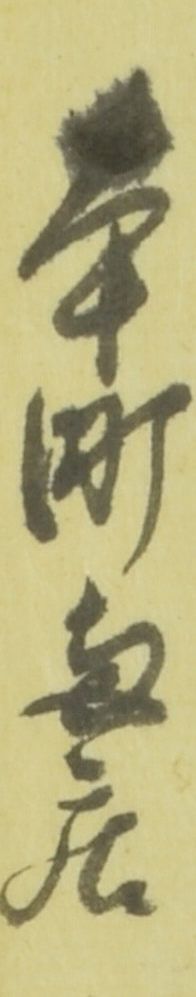本町両店
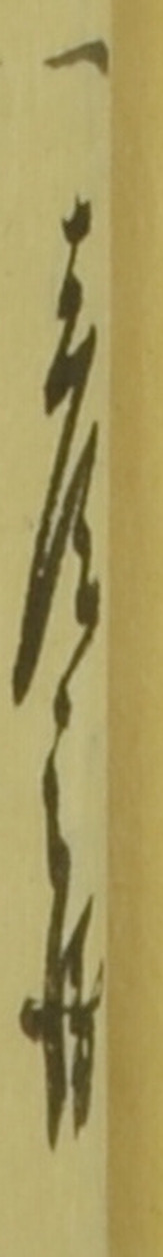彦兵衛
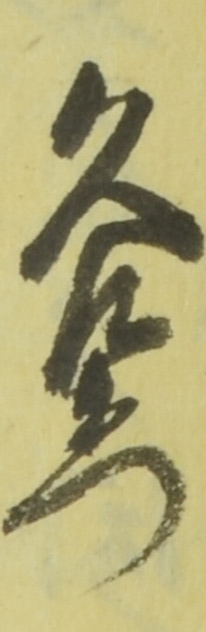久左衛門
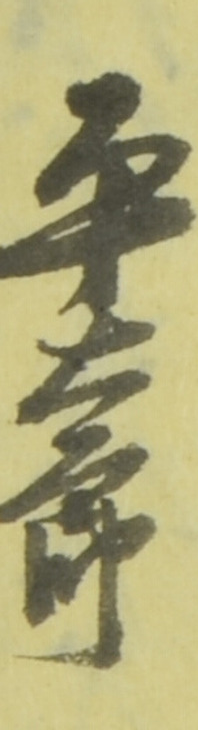平太郎

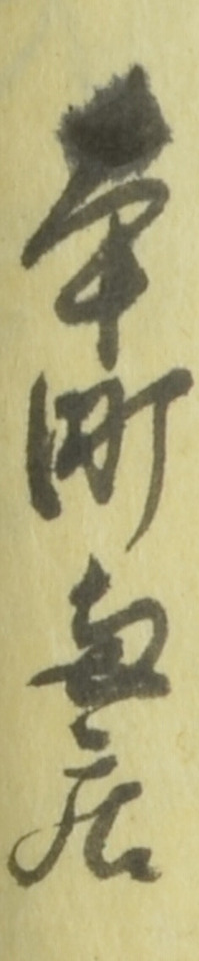本町両店
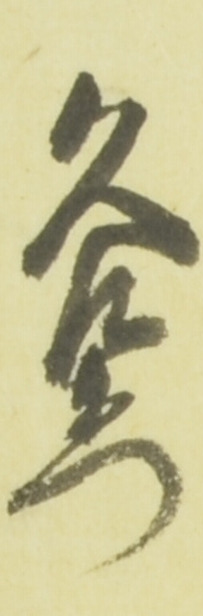久左衛門
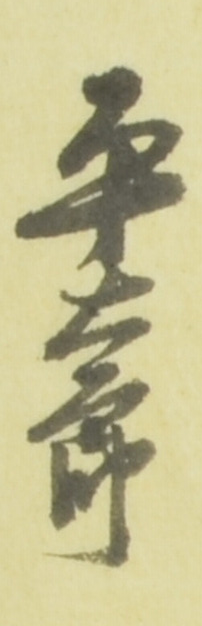平太郎
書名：御触書御書附控
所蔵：伊那市立高遠町図書館・合同会社AMANE
